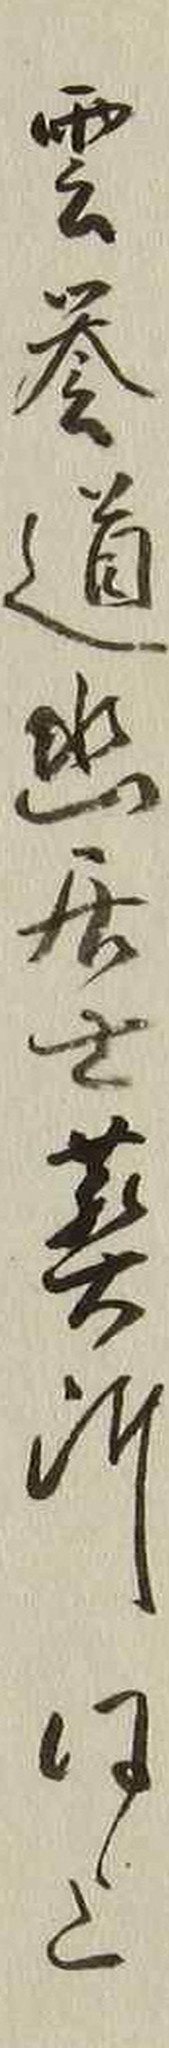雲誉道幽居士葬所同上
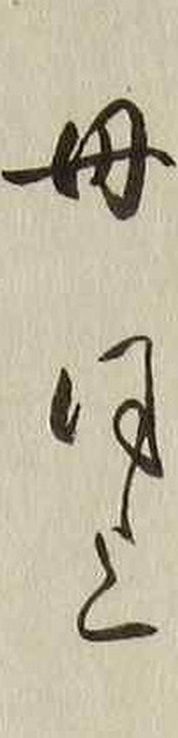母同上
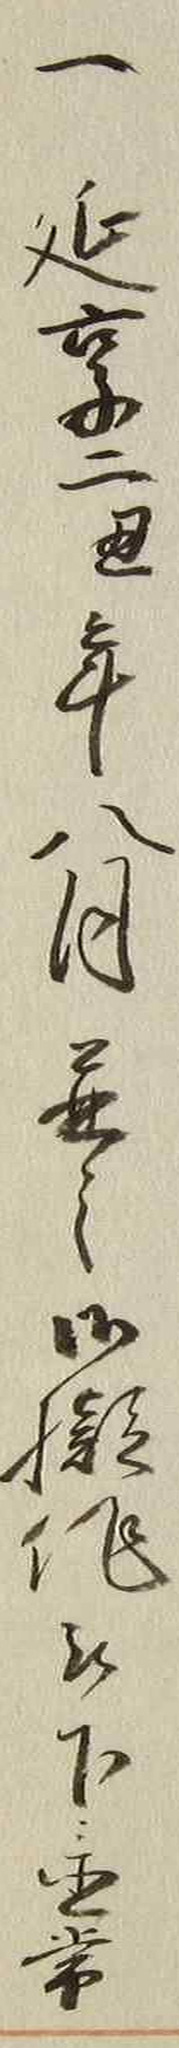一延享二丑年八月並之御擬作被下置常
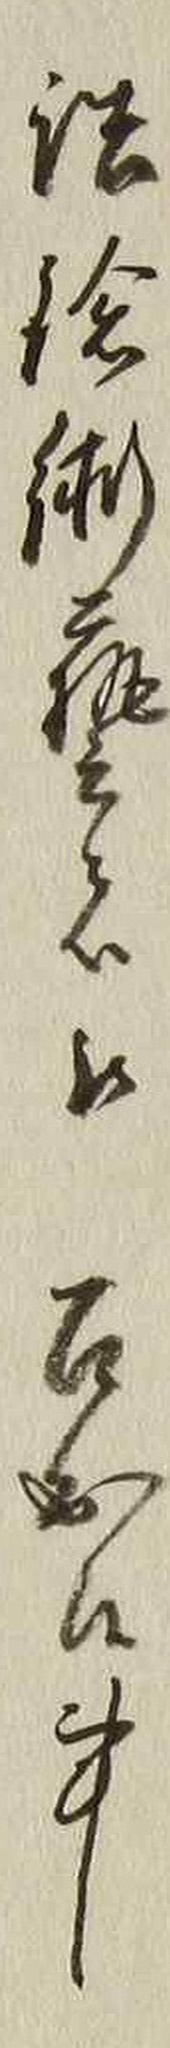詰槍術芸者被召出候事
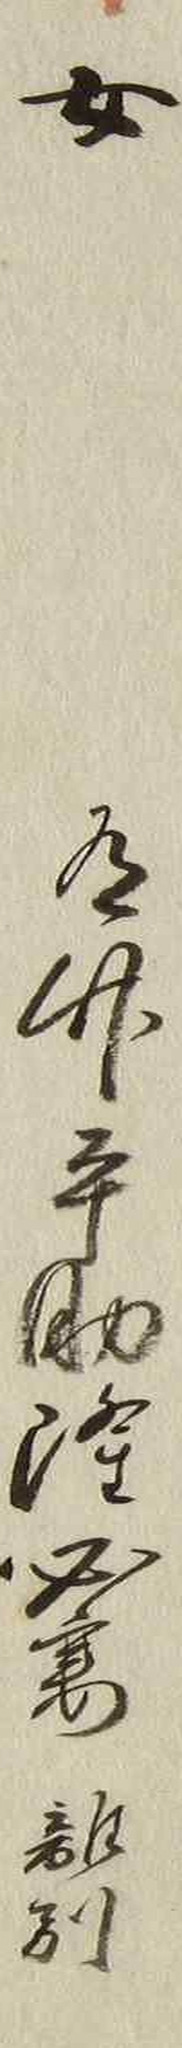女有竹平助隆必妻離別
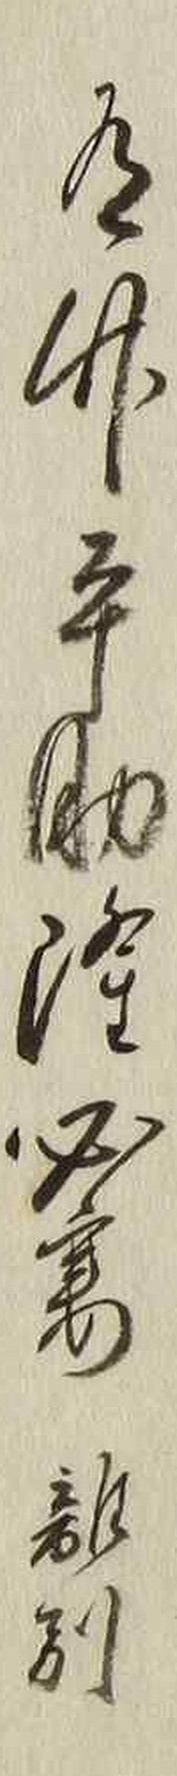女有竹平助隆必妻離別
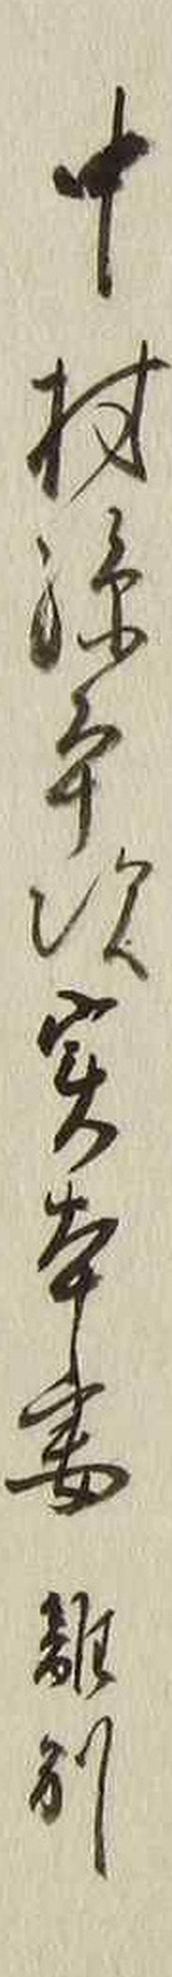十村孫平次実本妻難別
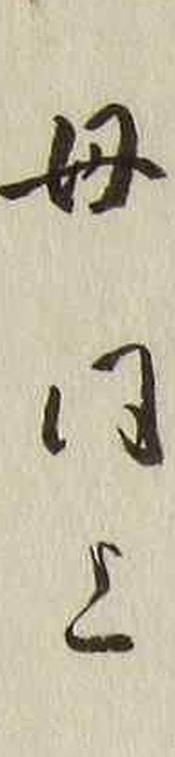母同上
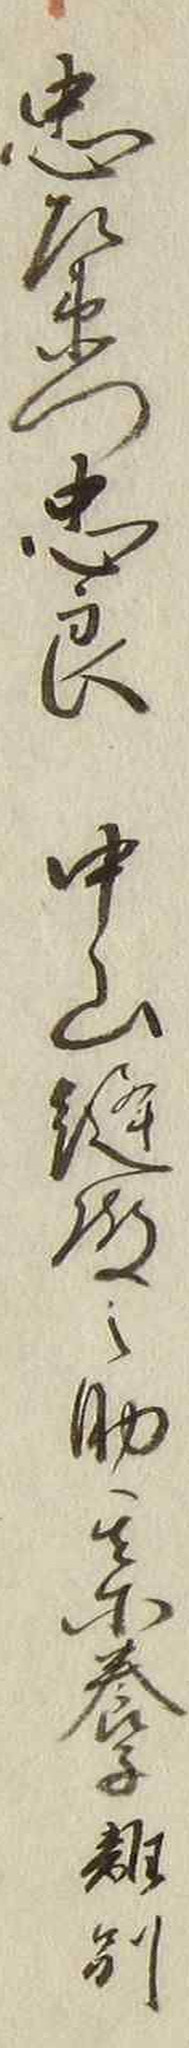忠左衛門忠良中山縫殿之助某養子離別
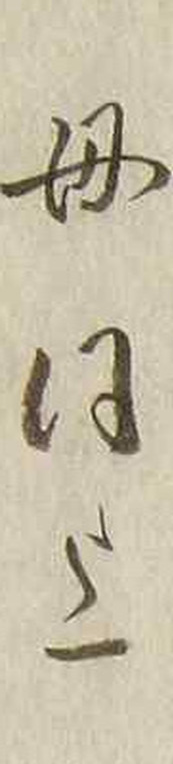母同上

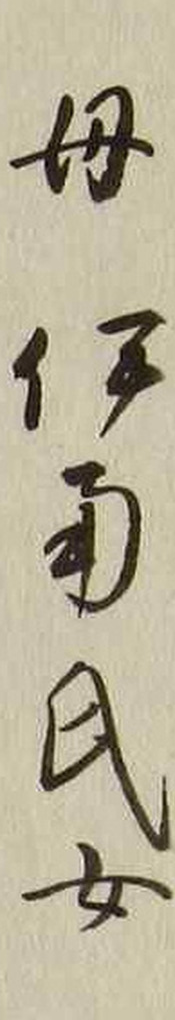母伊南氏女
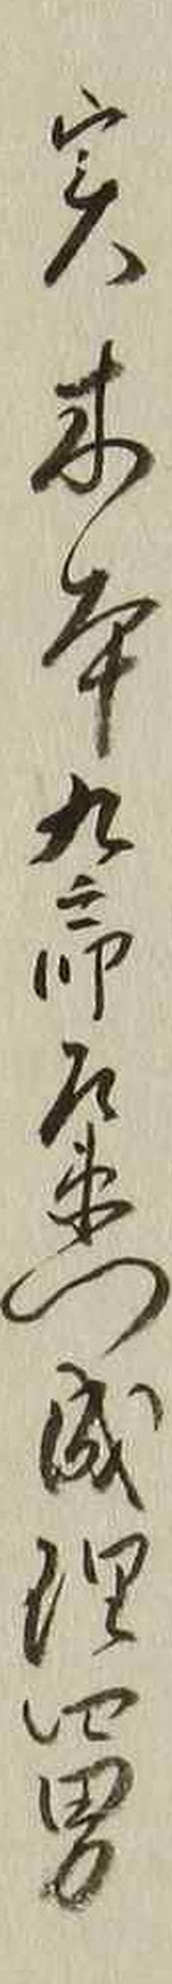実木本九郎左衛門成理四男
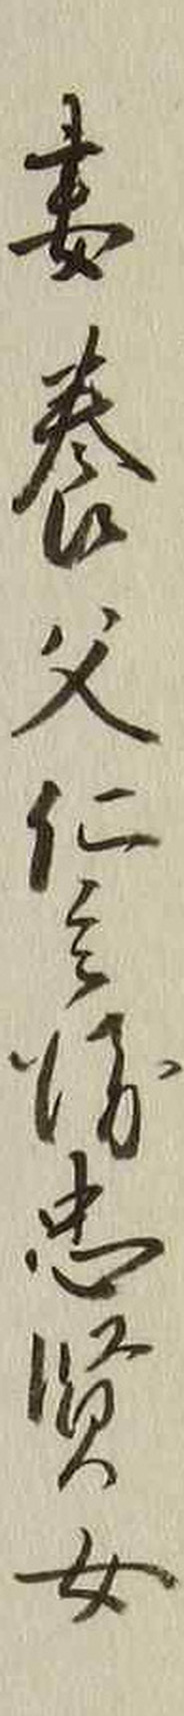妻養父仁兵衛忠賢女
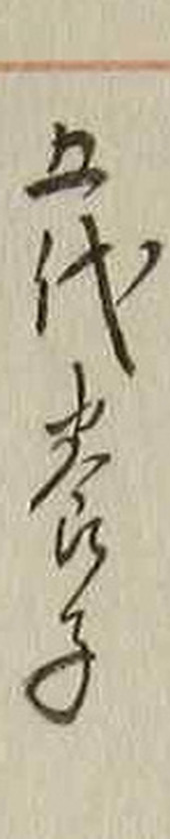五代養子
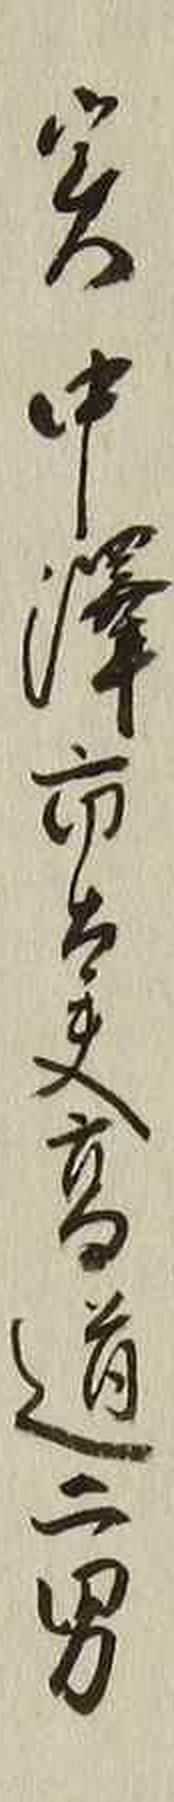実中沢市太夫高道二男
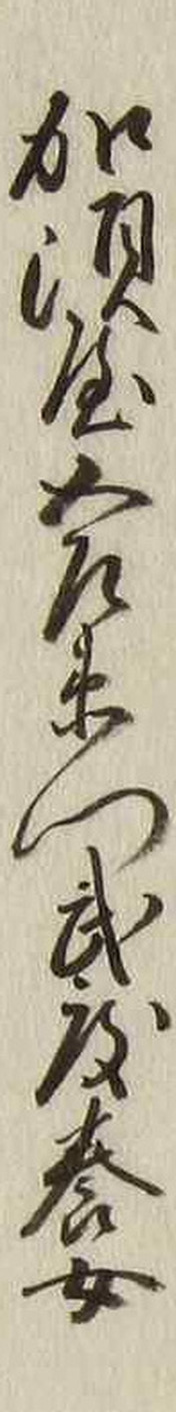加須屋五左衛門武度養女
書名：諸士系譜　巻之122　よ之部5
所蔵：会津若松市立会津図書館
